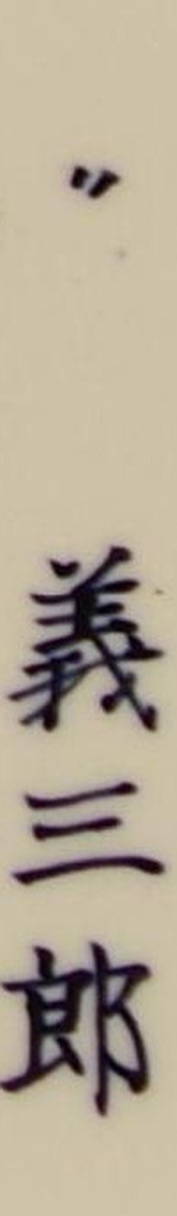義三郎
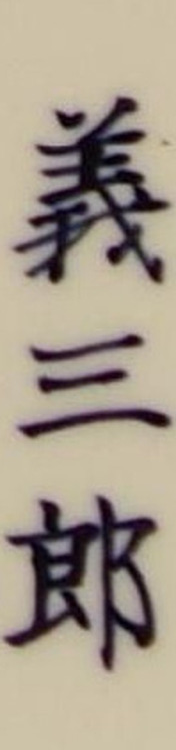義三郎
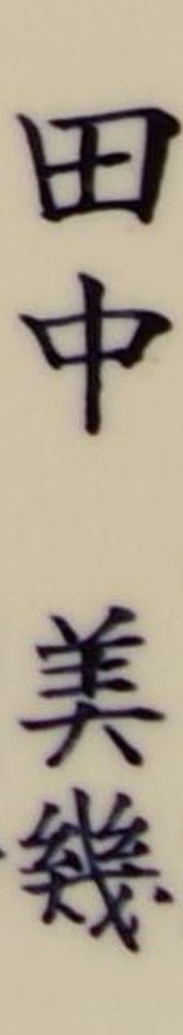田中美幾
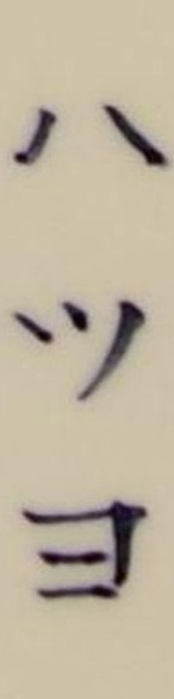ハツヨ
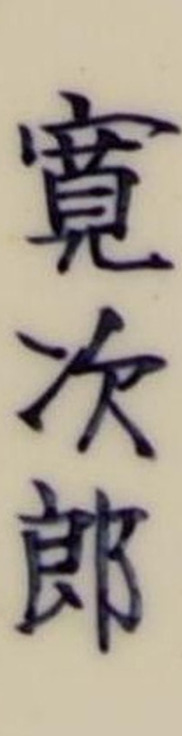寛次郎
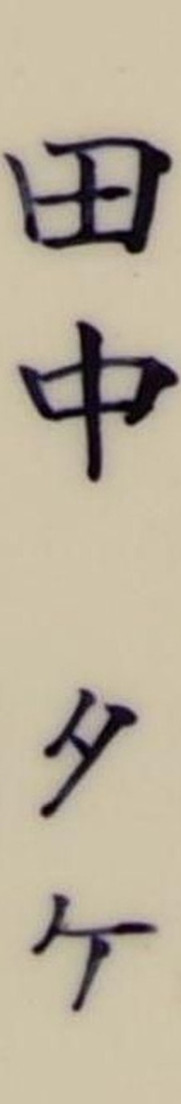田中タケ
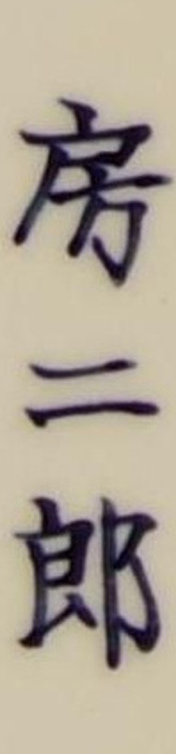房次郎
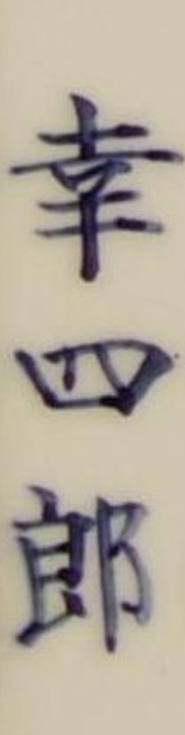幸四郎

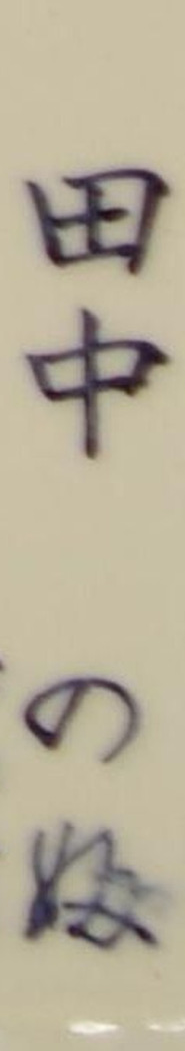田中のふ
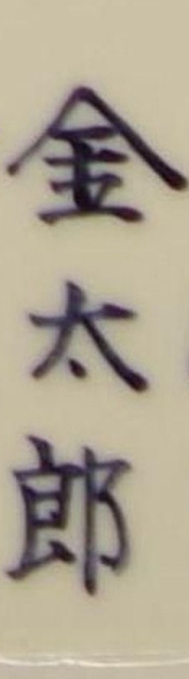金太郎
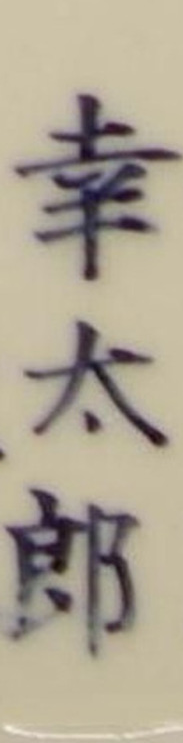幸太郎
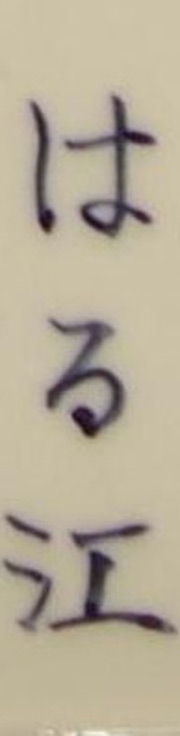はる江
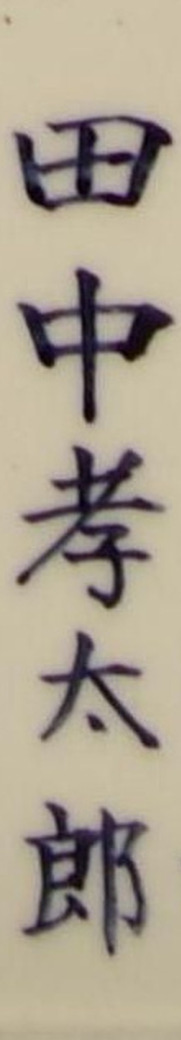田中孝太郎

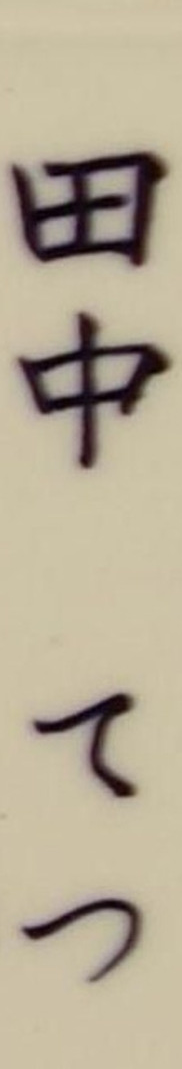田中てつ
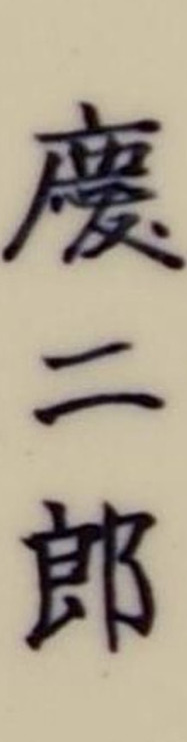慶二郎
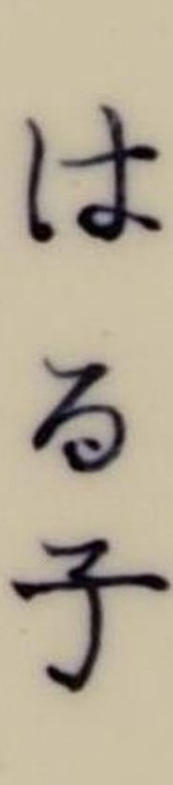はる子
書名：A~D
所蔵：koyasan kongobuji
